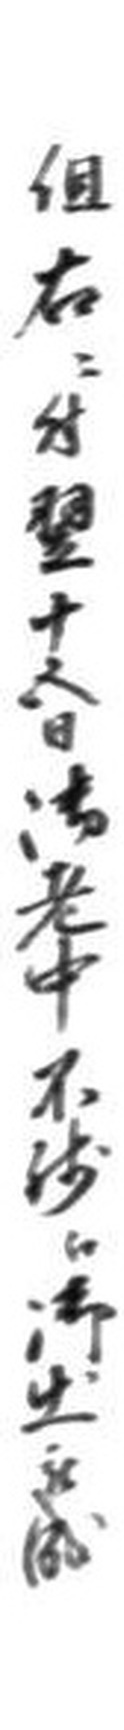但右ニ付翌十五日御老中不残江御出被成
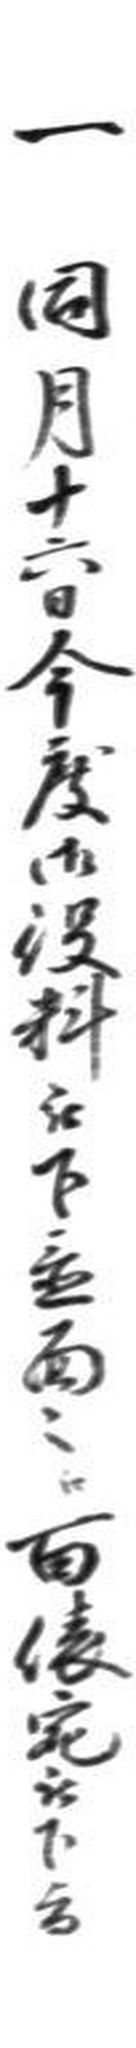一同月十六日今度御役料被下置面々江百俵宛被下旨

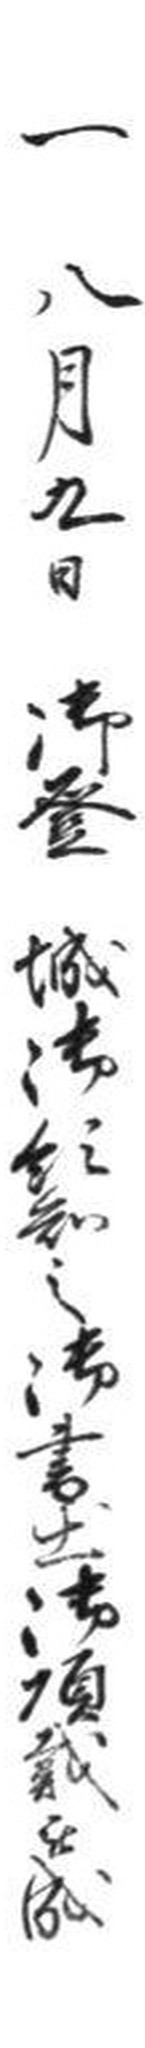一八月九日御登城御領知之御書出御頂戴被成
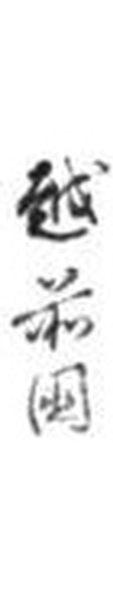越前国
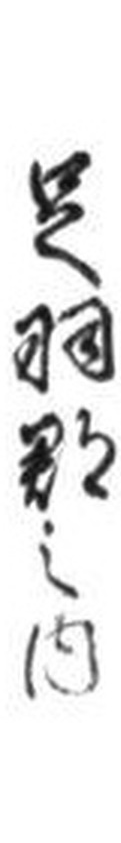吉田郡之内
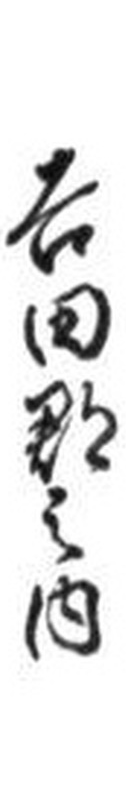吉田郡之内
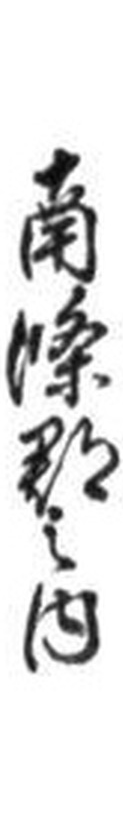南條郡之内
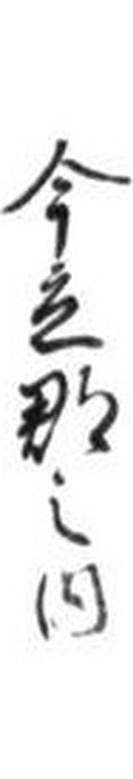今立郡之内
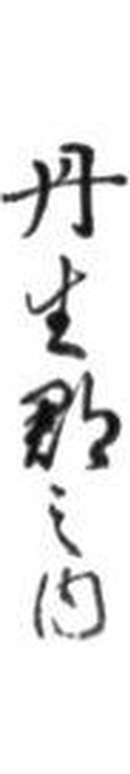丹生郡之内
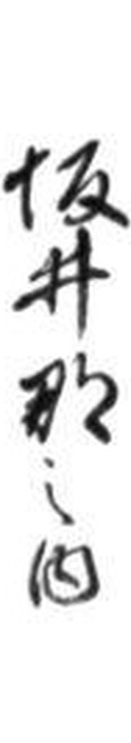坂井郡之内
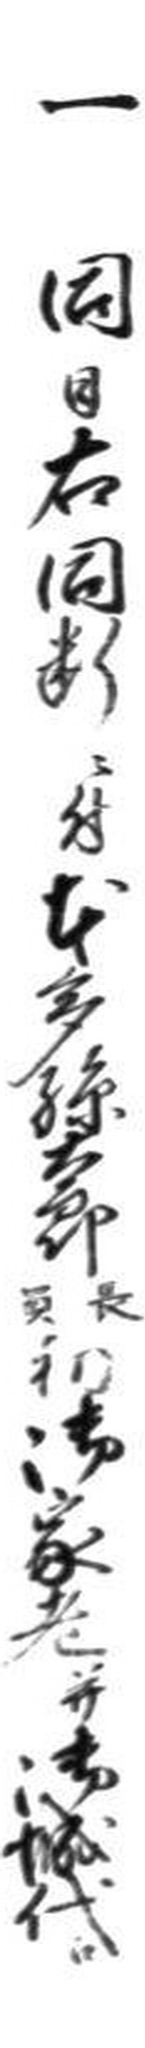一同日右同断ニ付本多孫太郎長員初御家老幷御城代江
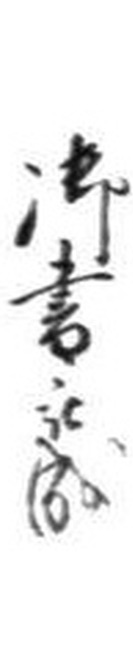御書被成
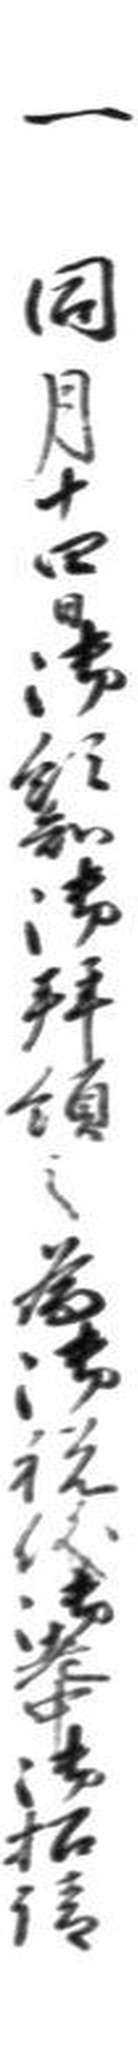一同月十四日御領知御拝領之為御祝儀御老中御招請
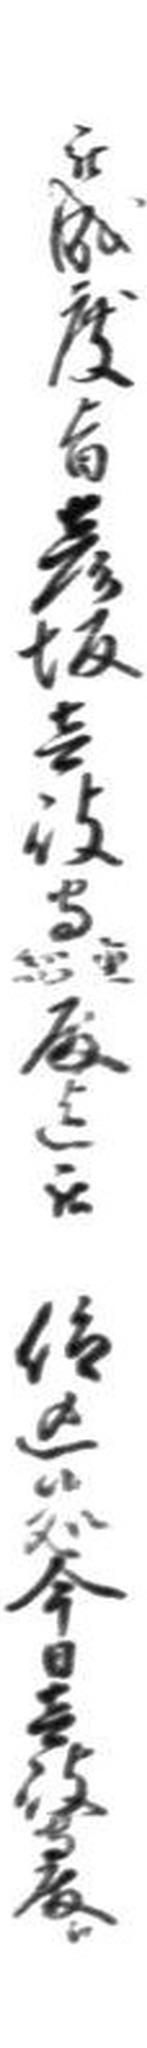被成度旨彦坂壱岐守重紹殿迄被仰込候処今日壱岐守殿江
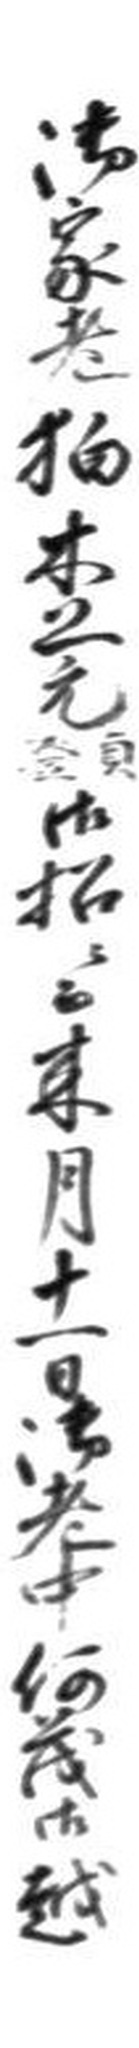御家老狛杢允貞澄御招ニ而来月十一日御老中何茂御越
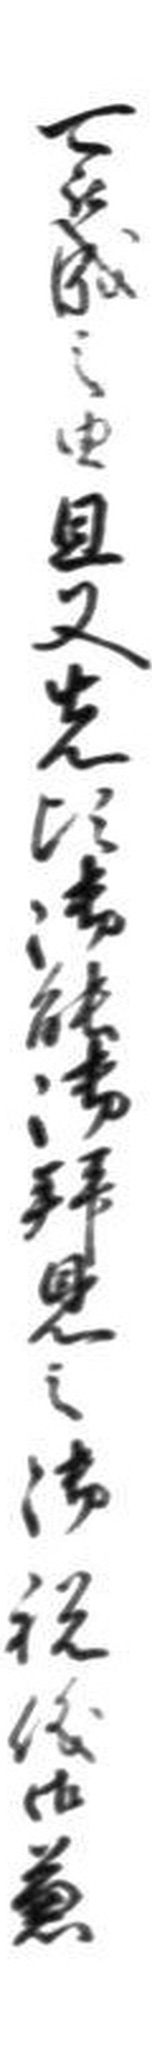可被成之由且又先頃御能御拝見之御祝儀御兼
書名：家譜 十六 吉品公 従貞享三年閏三月到同四年
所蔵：福井県文書館 Fukui Prefectural Archives
